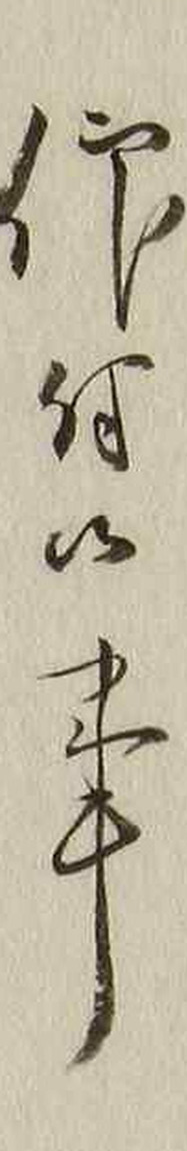仰付候事
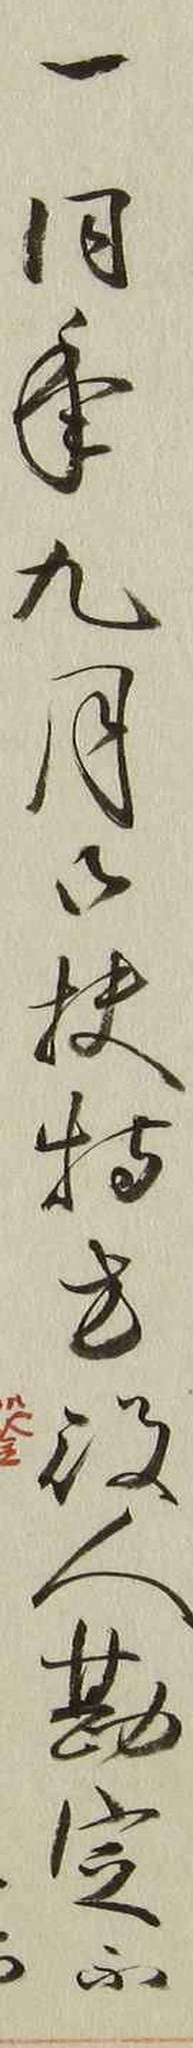一同年九月御扶持方役人勘定不
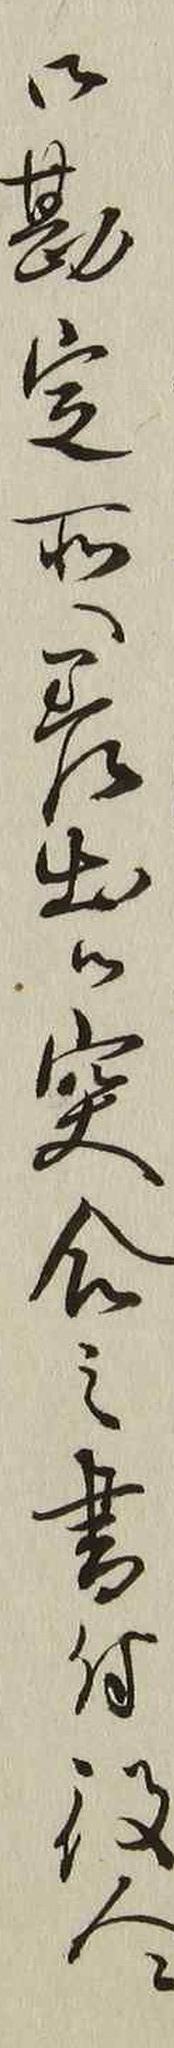御勘定所ㇸ差出候突合の書付役人ニ
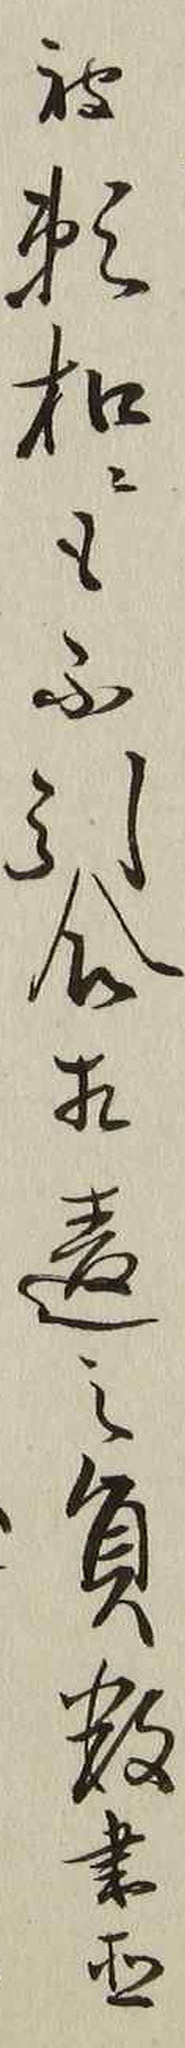被頼扣ニも不引合相違之員数書直
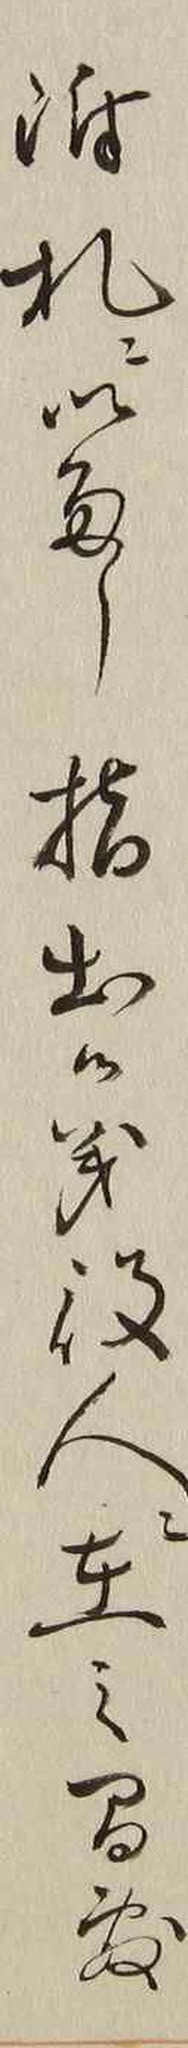附札ニいたし指出候義役人ニ在之間敷
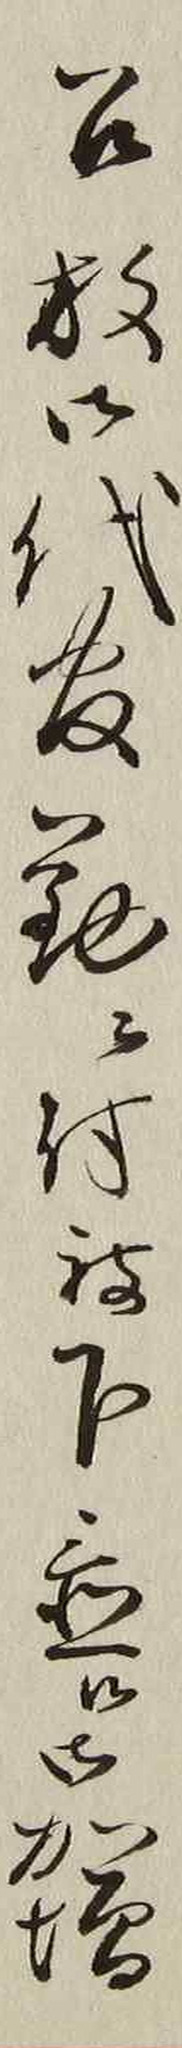召放御代官勤ニ付被下置候御加増
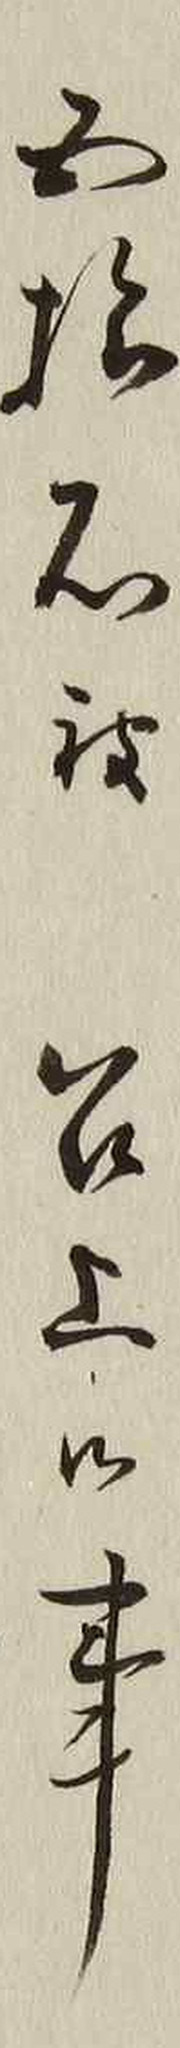五拾石被召上候事
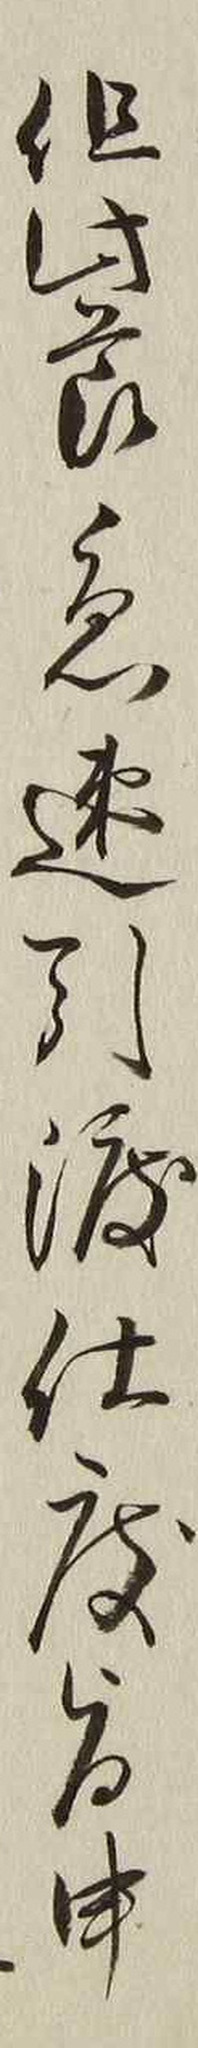但此節急速引渡仕度旨申
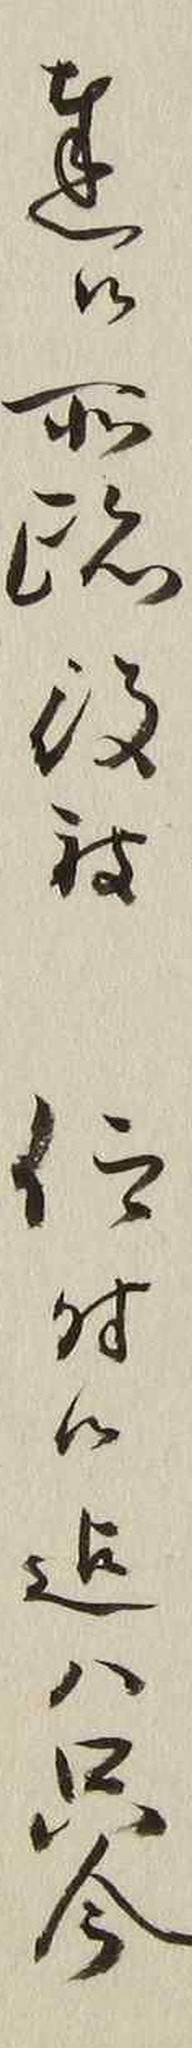達候所跡役被仰付候迄は只今
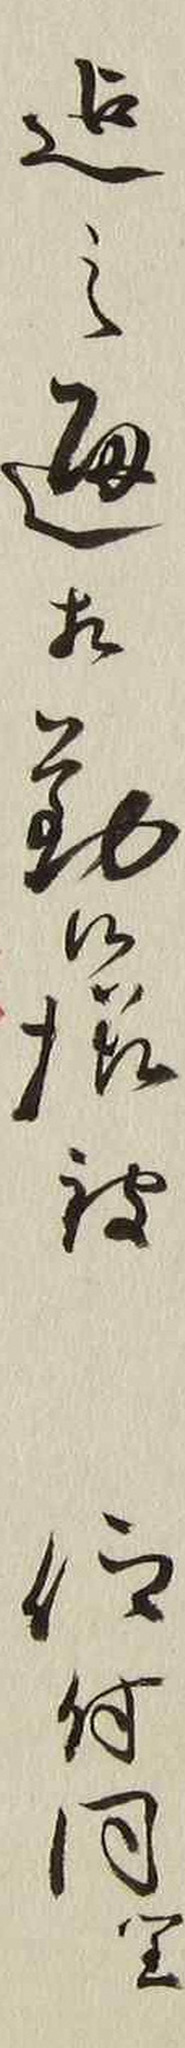迄之通相勤候様被仰付同閏
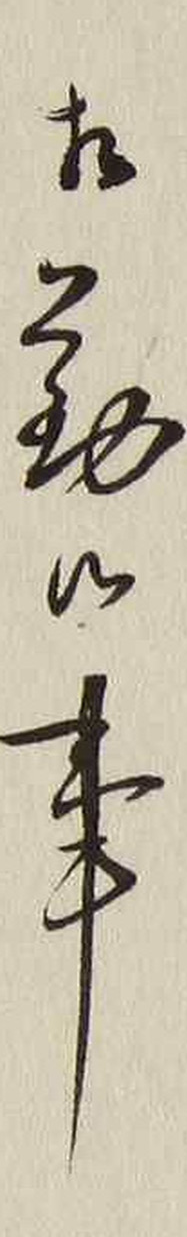相勤候事
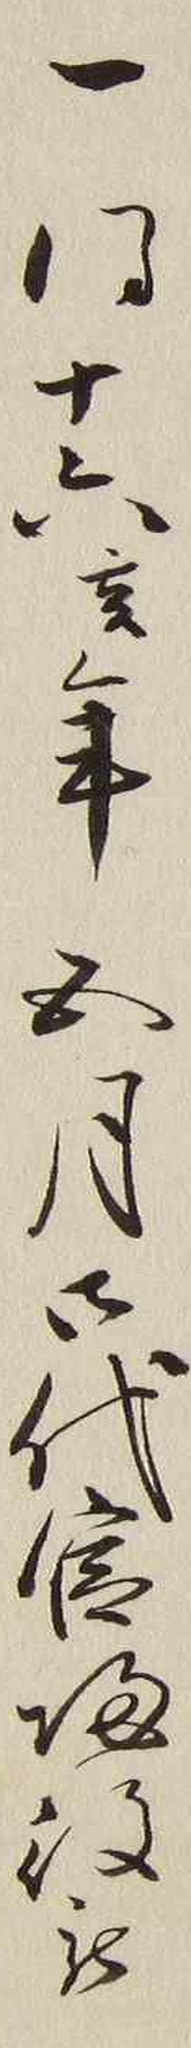一同十六亥年五月御代官帰役被
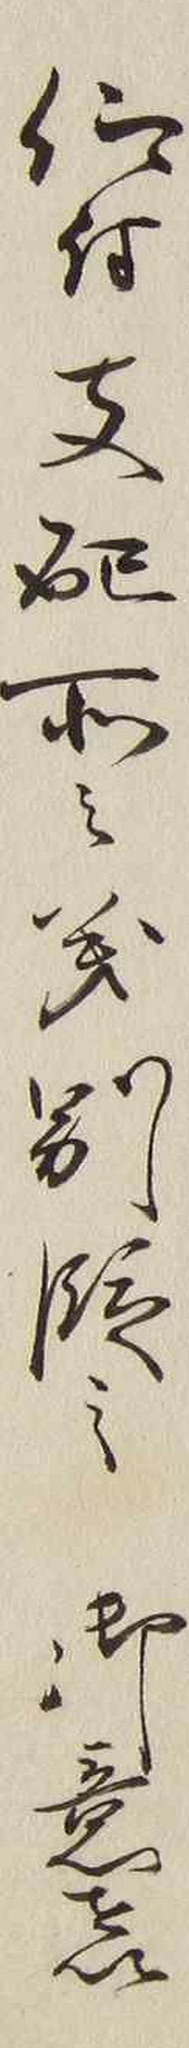仰付支配所之義別段之御意を以

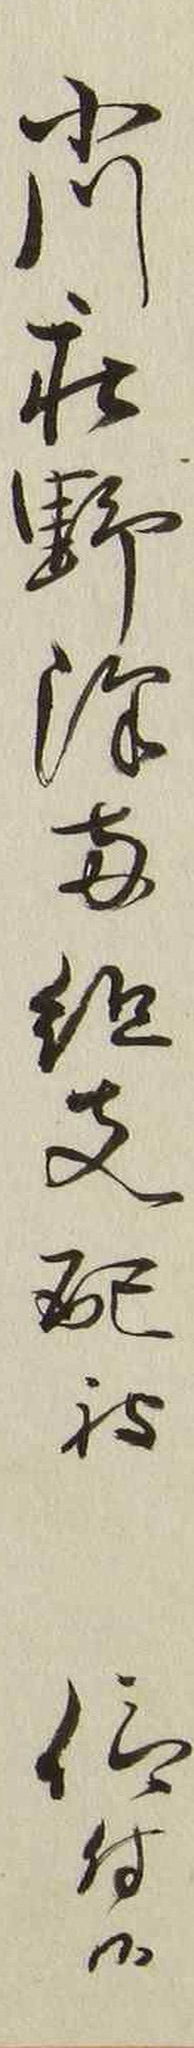小川庄野沢両組支配被仰付候
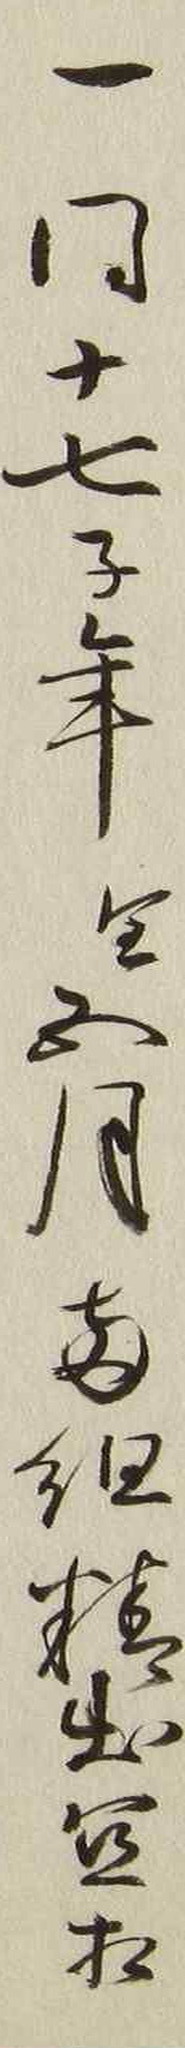一同十七子年閏五月両組精出宜相
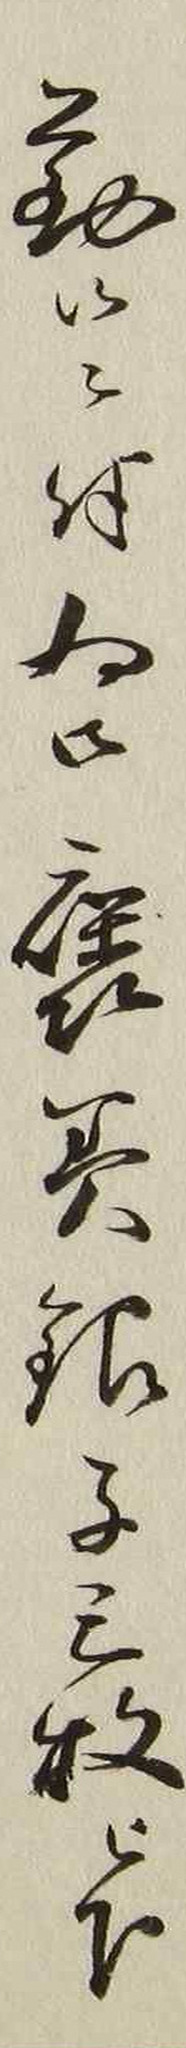勤候ニ付為御褒美銀子三枚被下
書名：諸士系譜　巻之163　な之部5
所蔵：会津若松市立会津図書館
